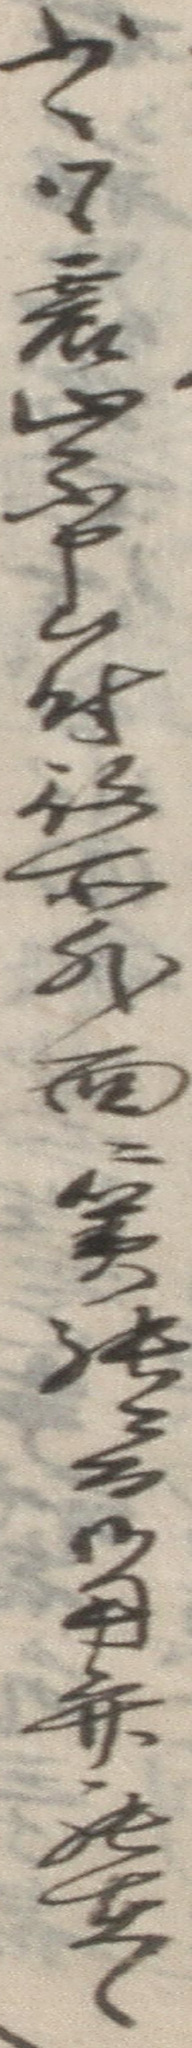少々ツヽ震止不申候付役所外面ニ簀張二而御用弁罷在候
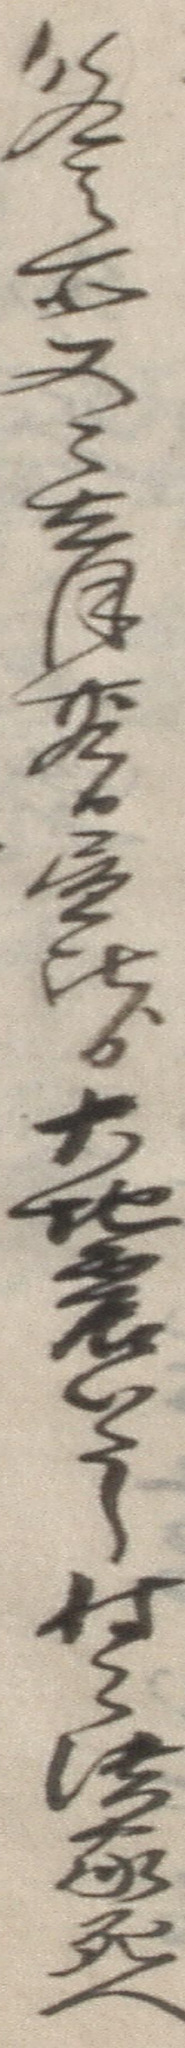仕合之所又々去月廿九日昼比ゟ大地震いたし村々潰家死人
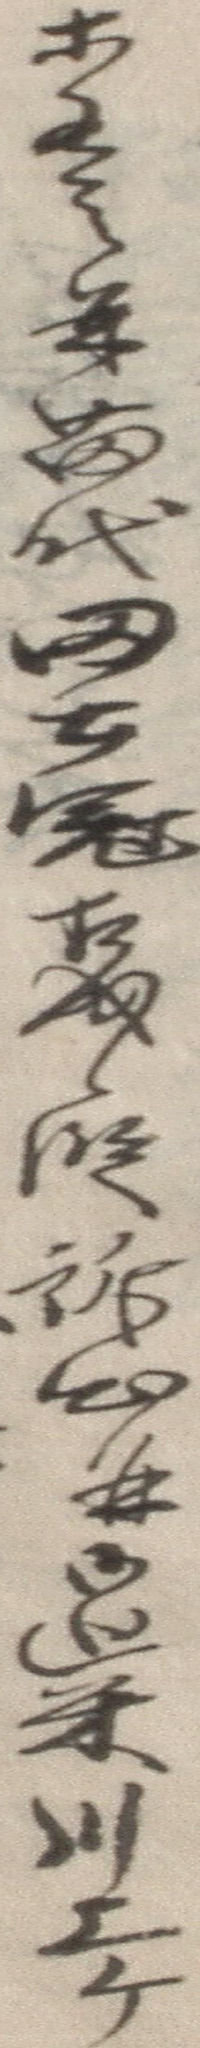等有之幷苗代田土冠相成候段訴出幷御廻米川上ケ
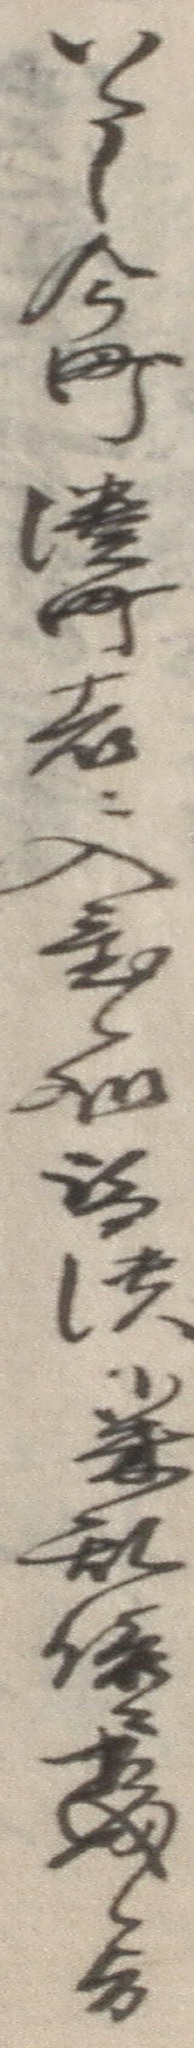いたし今町湊町表二入置候処皆潰御米乱俵二相成候旨
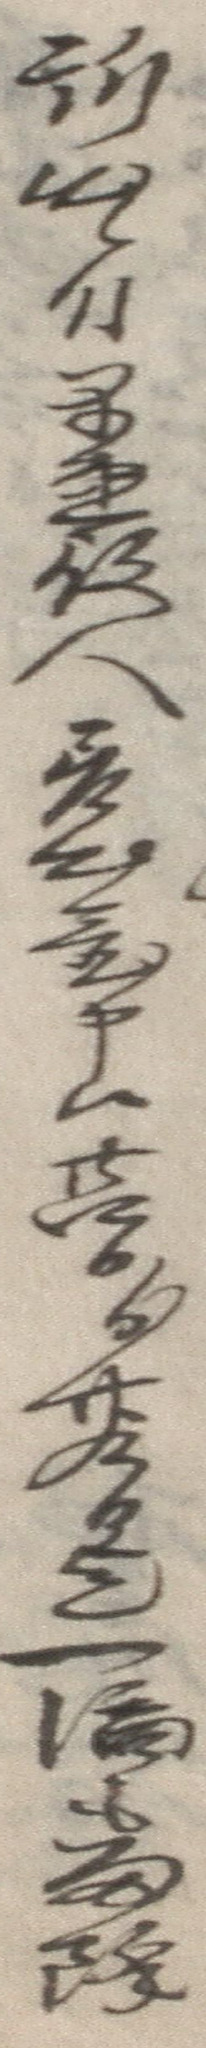訴出候二付早速役人差出置申候廿四日ゟ廿九日迄一滴も雨降
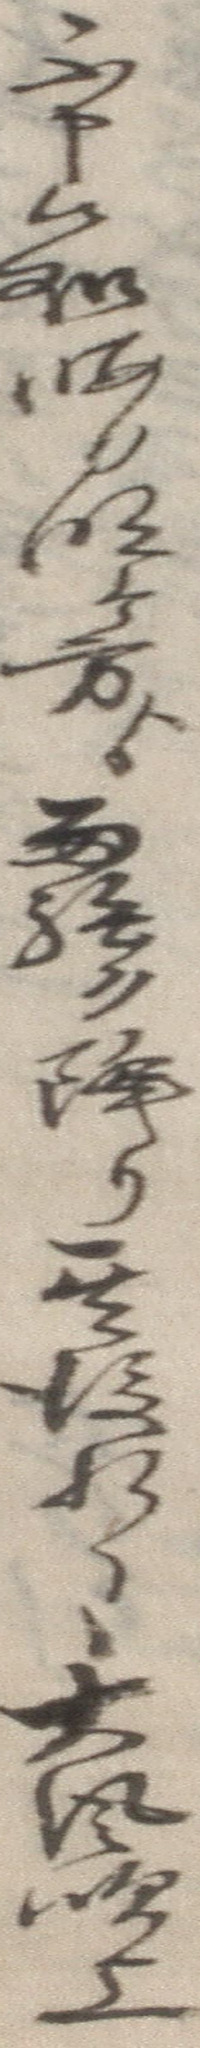不申候処晦日明ケ方ゟ雨強ク降り其後折々大風吹上
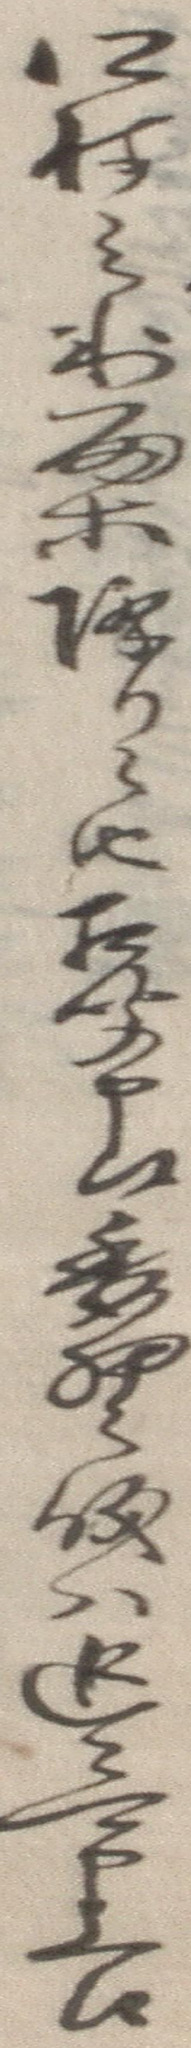郷村々氷雨等降候由相聞申候委細之儀ハ追々可申上候
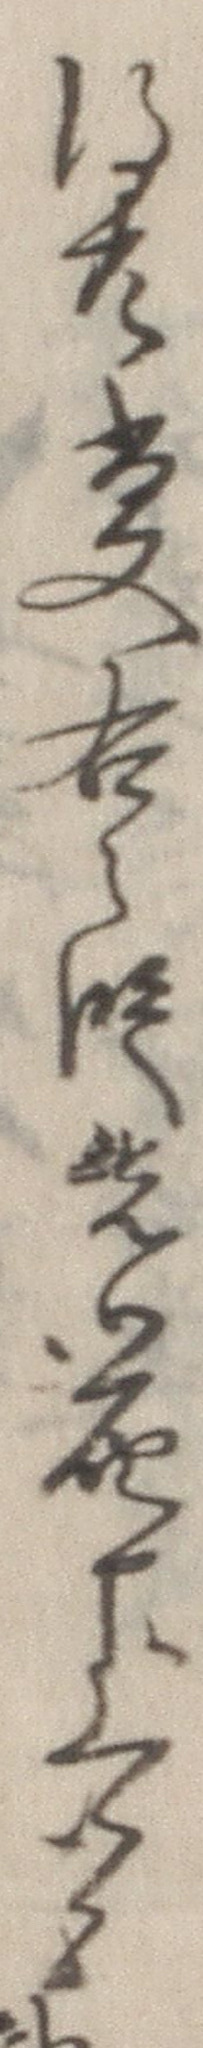得共尚又右之段先御届申上候以上
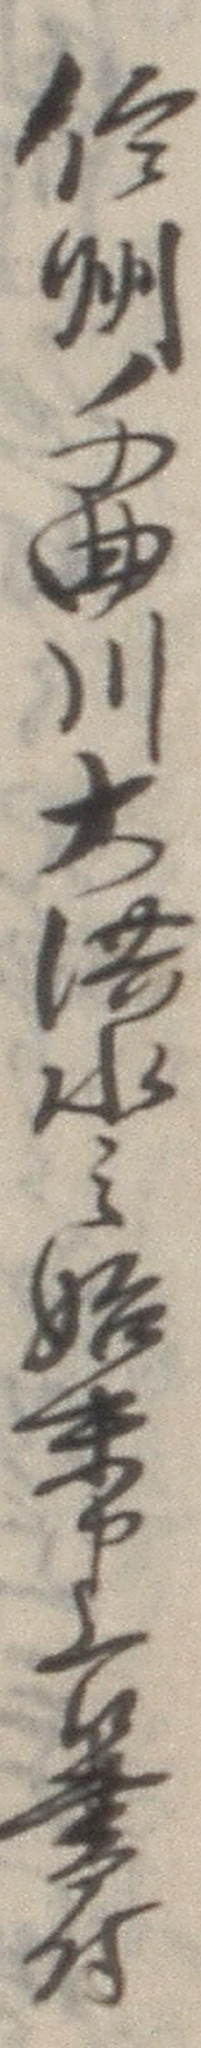信州千曲川大洪水之始末申上候書付
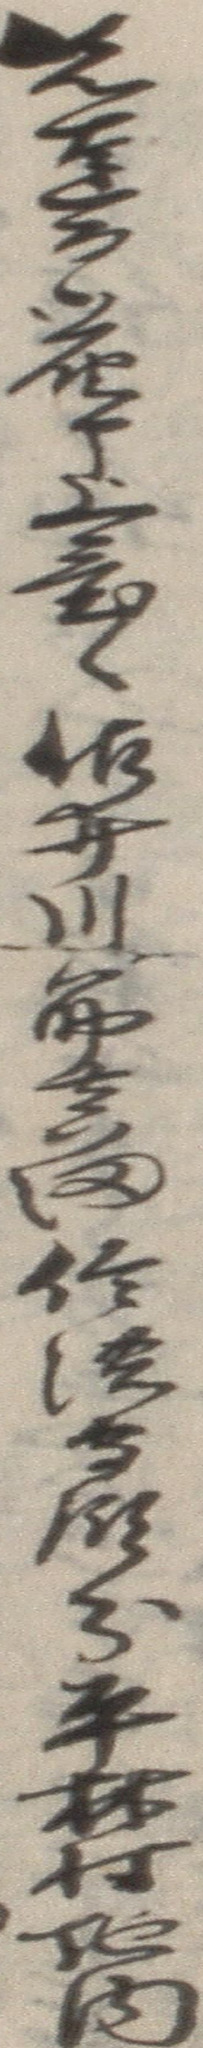先達而御届申上置候佐井川筋真田信濃守領分平林村地内
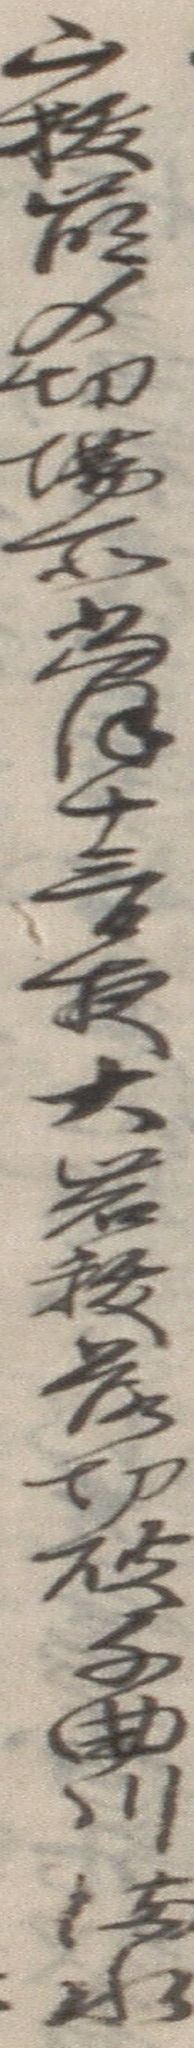山抜崩〆切場所当月十三日夜大岩抜落切破千曲川満水
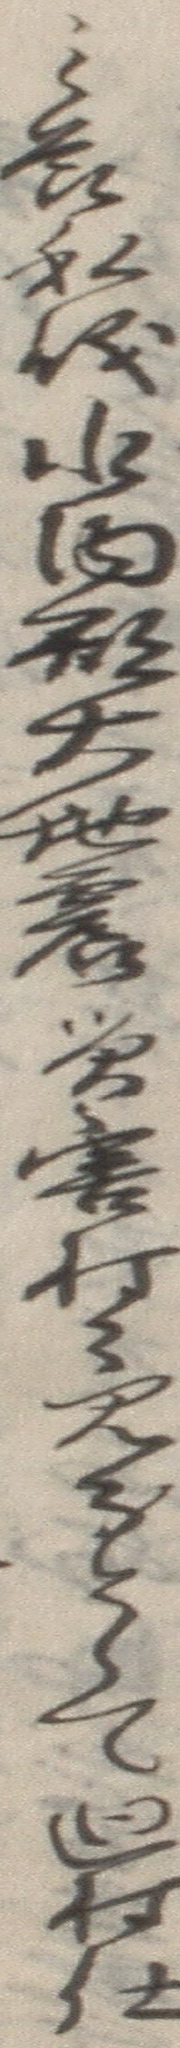之節私儀水内郡大地震災害村々見分として廻村仕
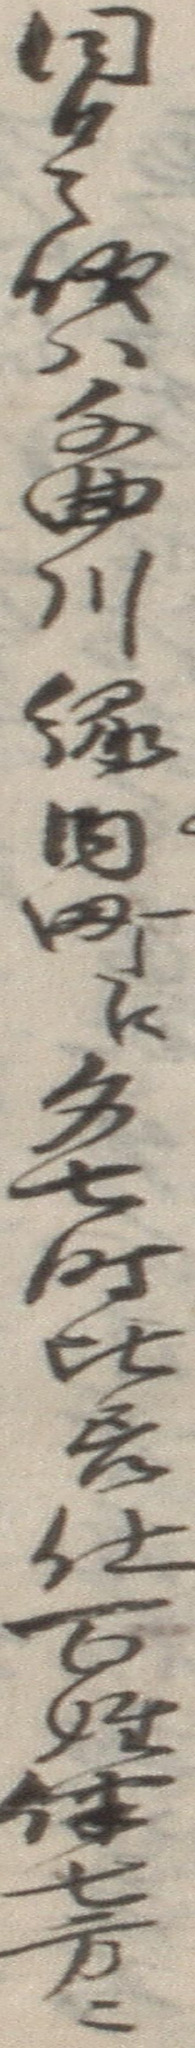同日之儀ハ千曲川縁内町江夕七時比着仕百姓伴七方二
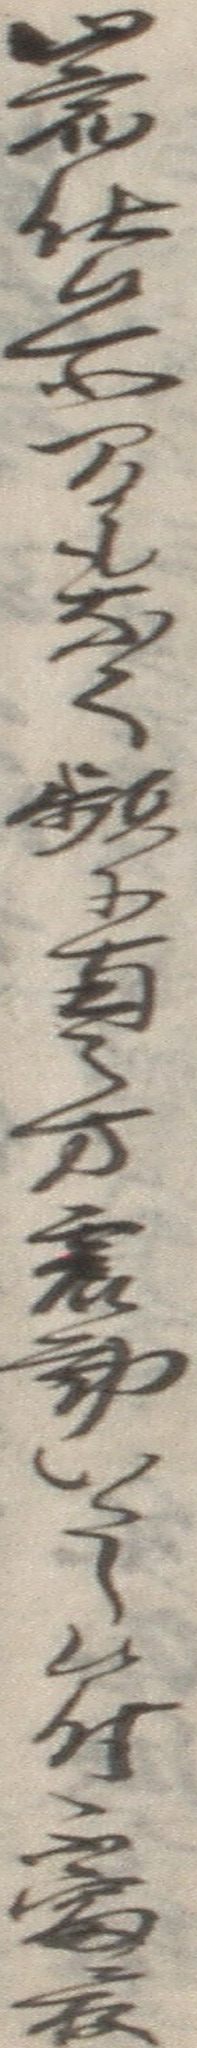止宿仕候所間もなく頻に南之方震動いたし候付不審二存
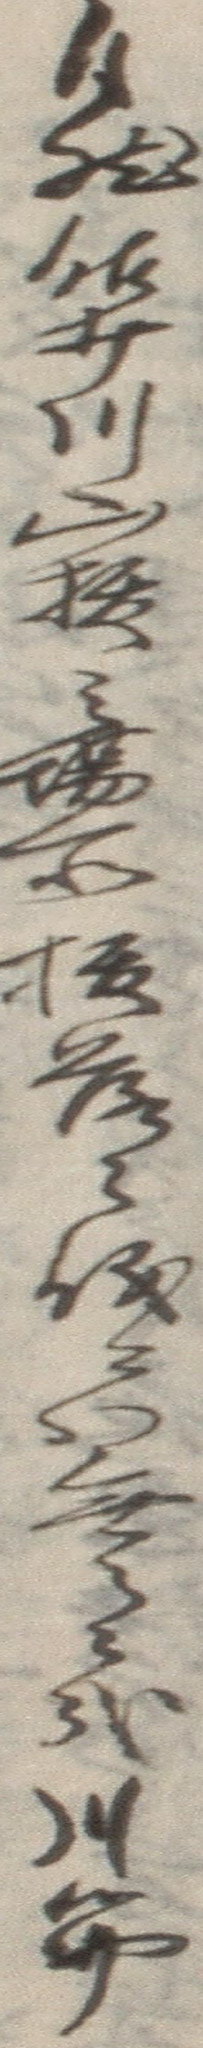自然佐井川山抜之場所抜落之儀二ハ無之候哉川筋
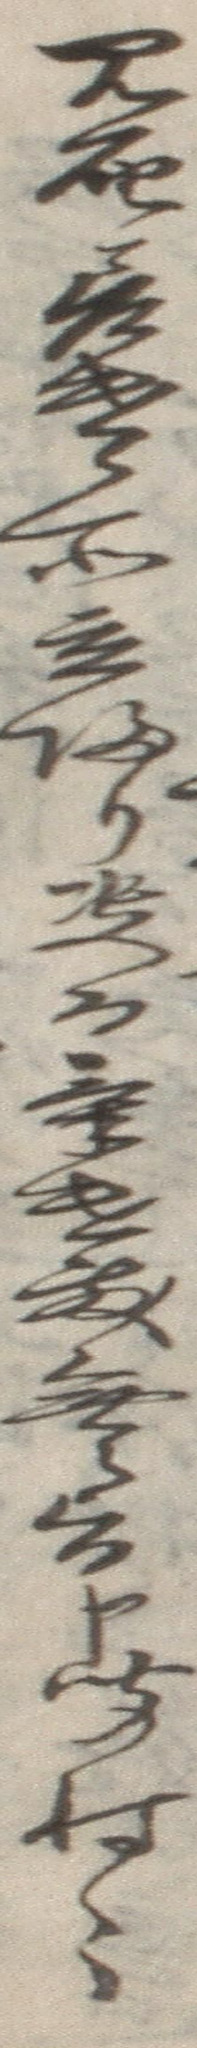見届差遣候所立帰決而気遣敷無之旨申聞村々
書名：信州地震一件
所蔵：東京大学地震研究所図書室 Earthquake Research Institute Library, The University of Tokyo, JAPAN
